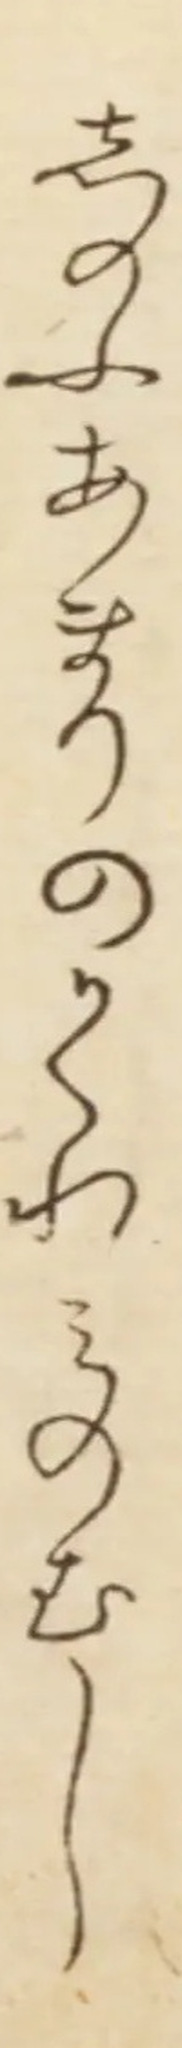しのふあまりのかくれみのむし
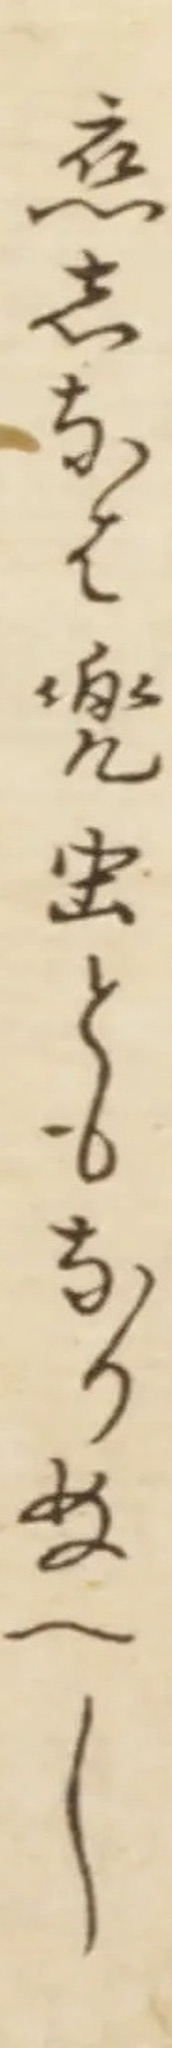恋しなは兜虫ともなりぬへし
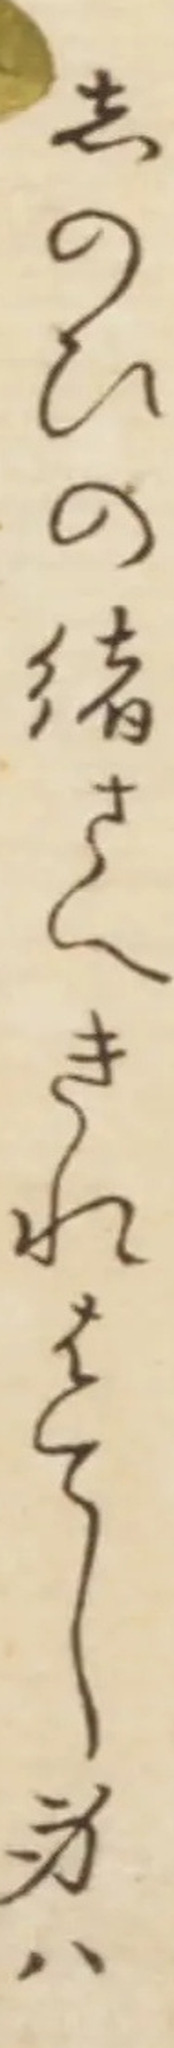しのひの緒さへきれはてし身は

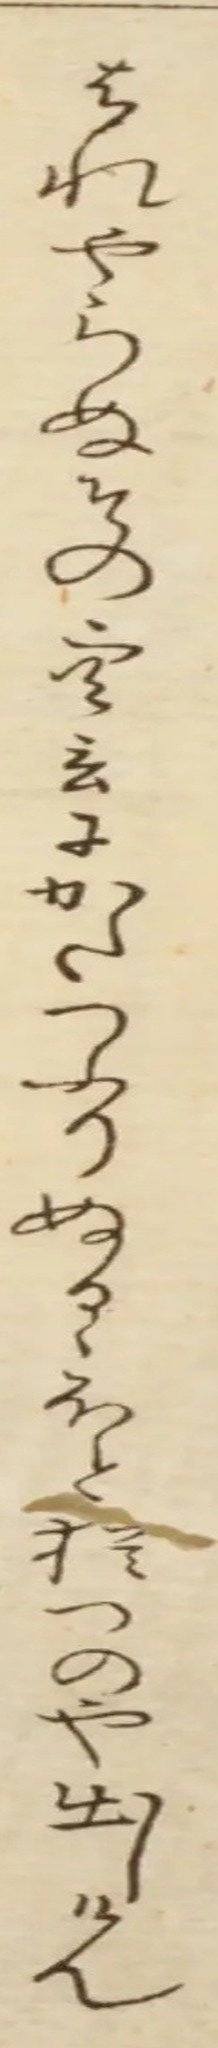はれやらぬその空言にかたつふりぬるゝほと猶つのや出しけん
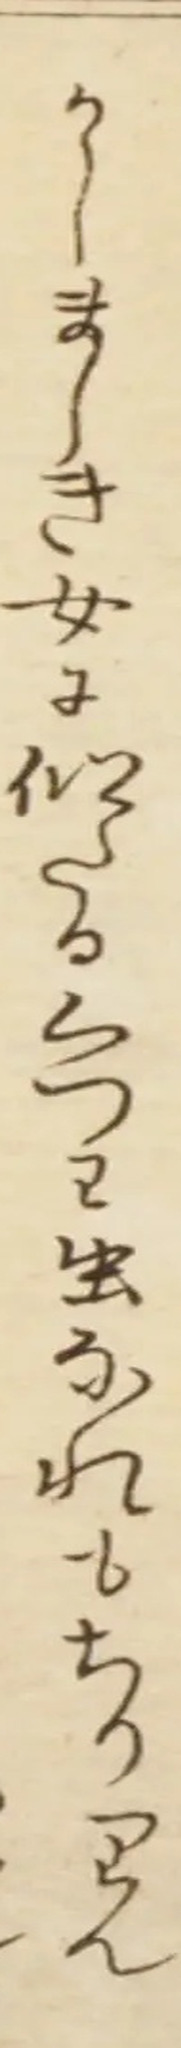かしましき女に似たるくつわ虫なれもちりりん
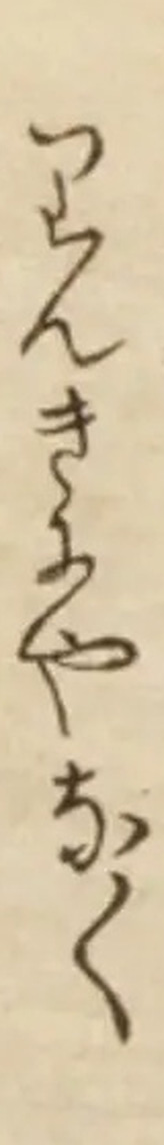りんきにやなく

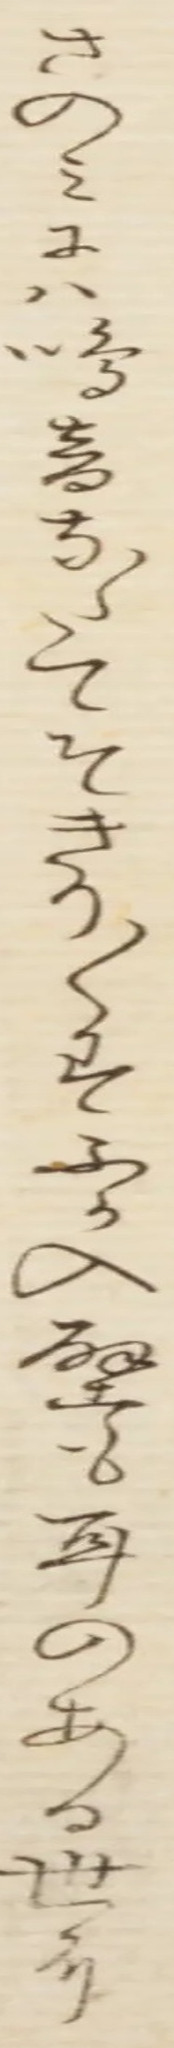さのみには鳴音なたてそきり〳〵すふか入壁も耳のある世に
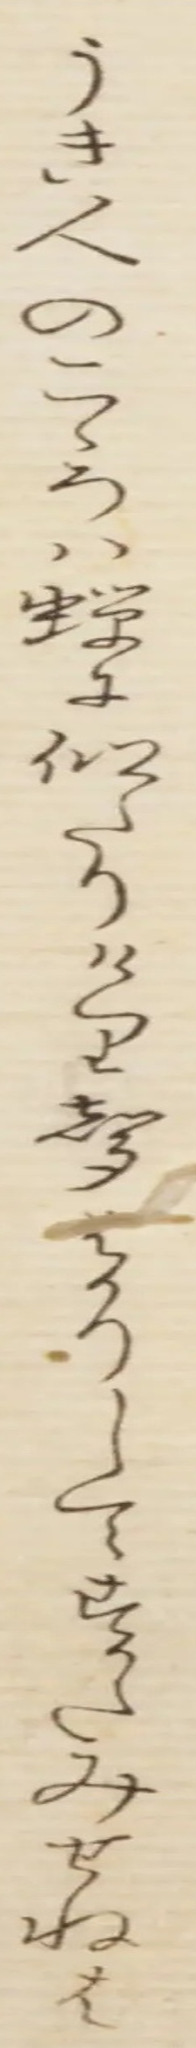うき人のこゝろは蝉に似たりけり声はかりしてすかたみせねは

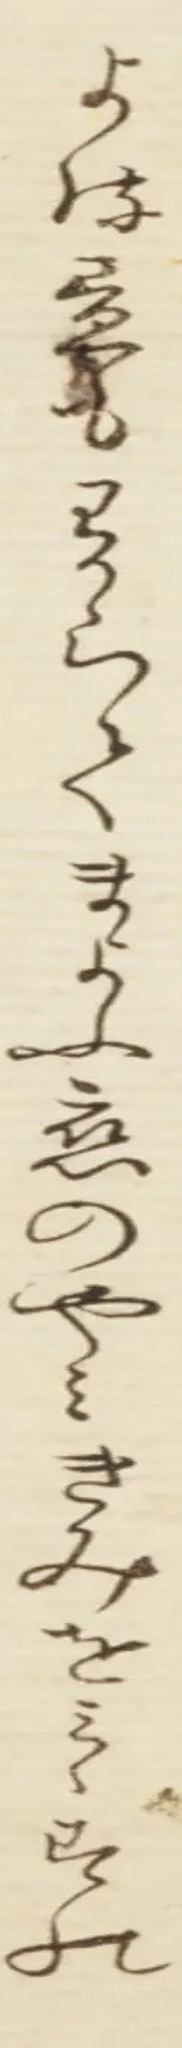よる昼もわからてまよふ恋のやみきみをみゝすの
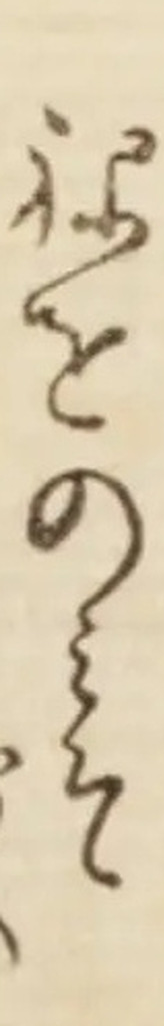ねをのみそ
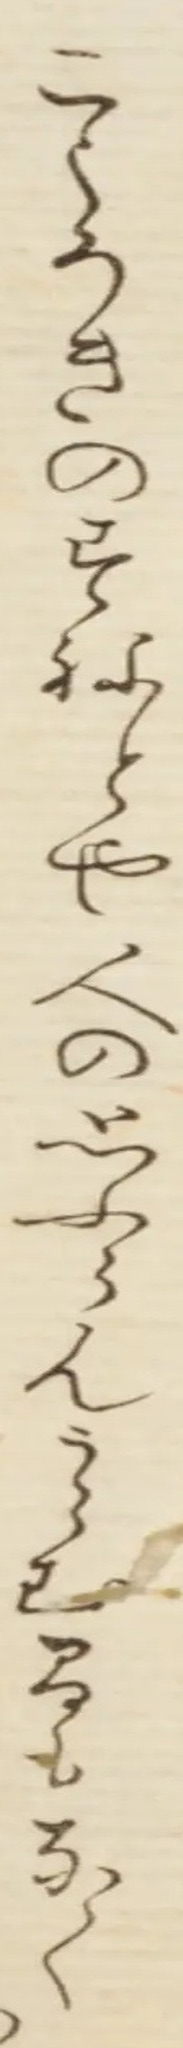こうろきのすねとや人の思ふらんうらむ間もなく
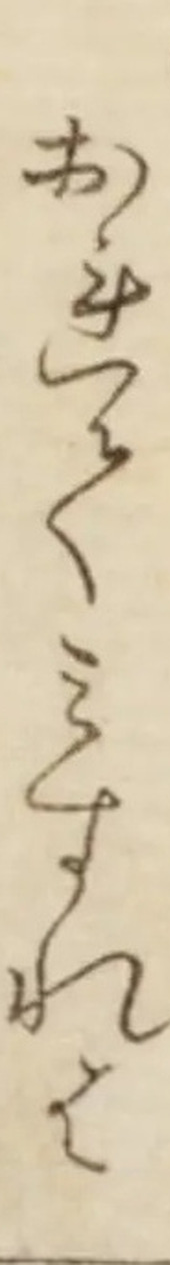おれてみすれは

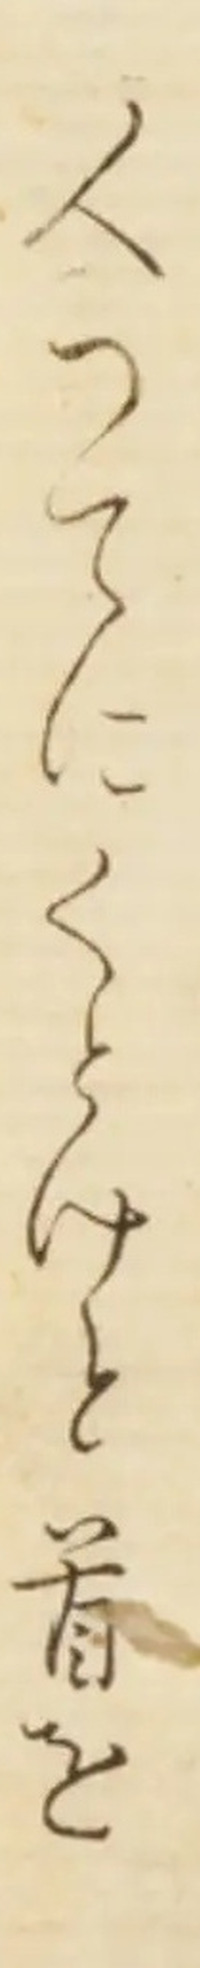人つてにくとけと首を
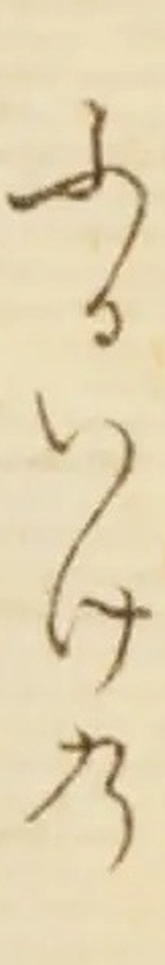ふるいけの
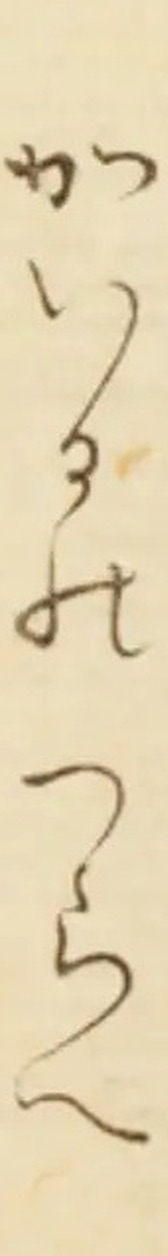かいるのつらへ
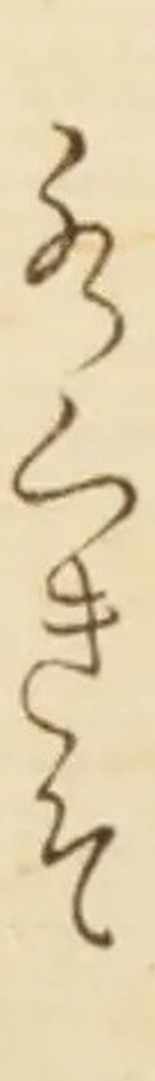水くきそ
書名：画本虫ゑらみ
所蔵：国立国会図書館 National Diet Library, JAPAN
